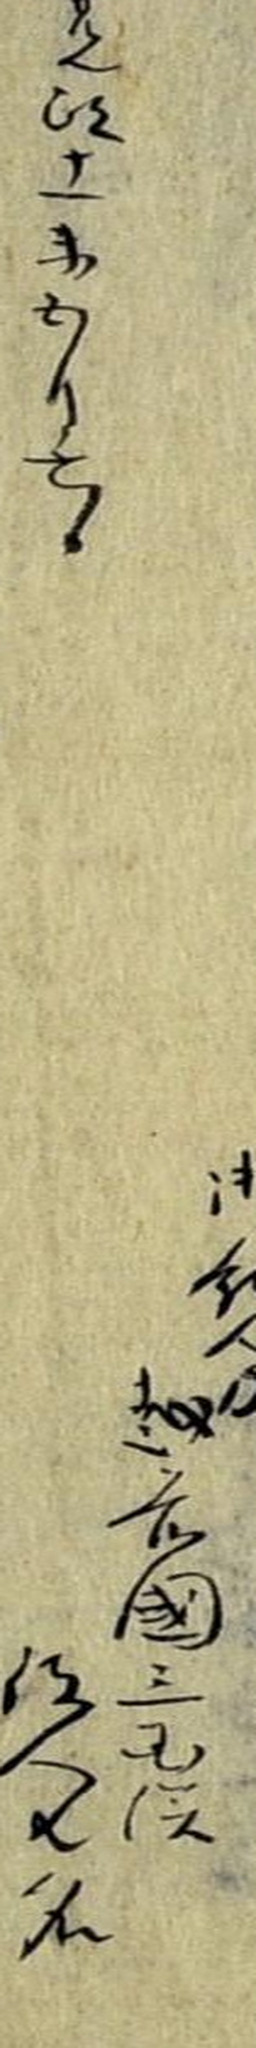寛政十一未五月七日役人共名
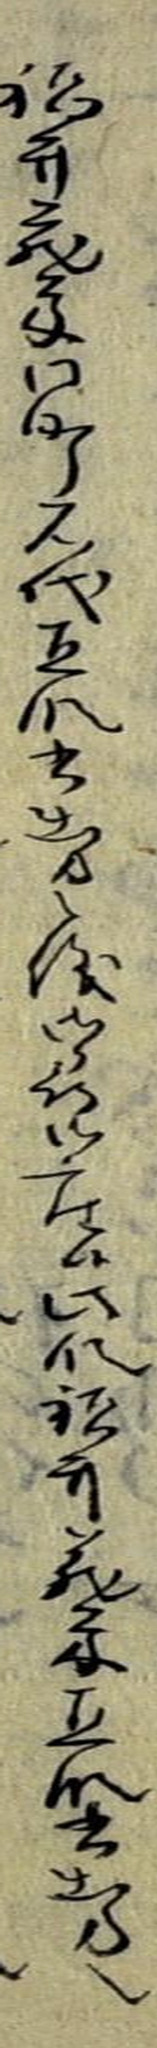福井蔵米同町石代直段書出方之儀御尋御座候此段福井蔵米直段書出方之
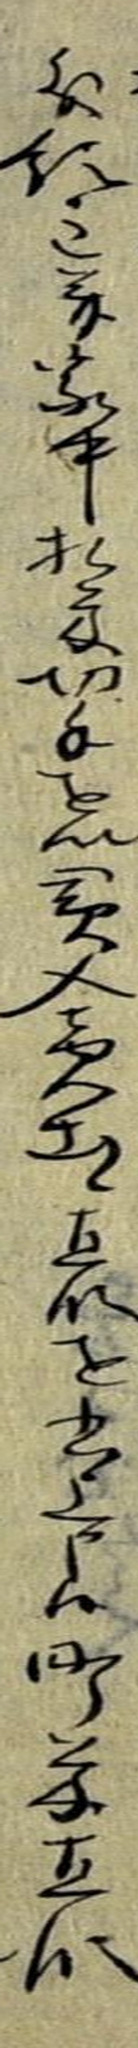義領主并家中払米切手を以買入売出候直段書上申候町米直段
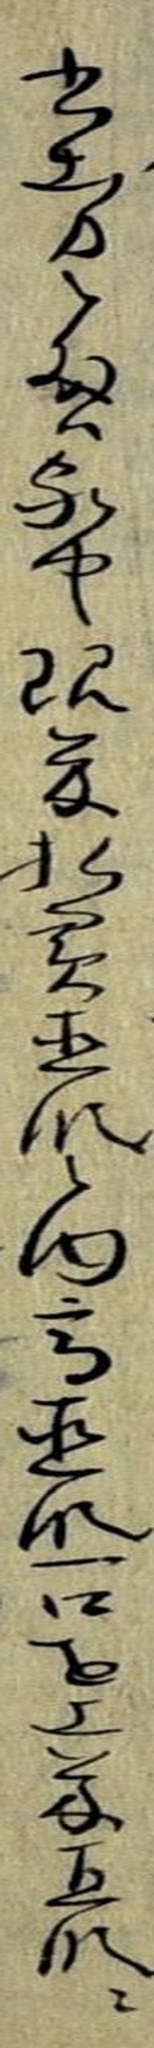書出方之義ハ家中限米払買直段之内高直段一口を上米直段ニ
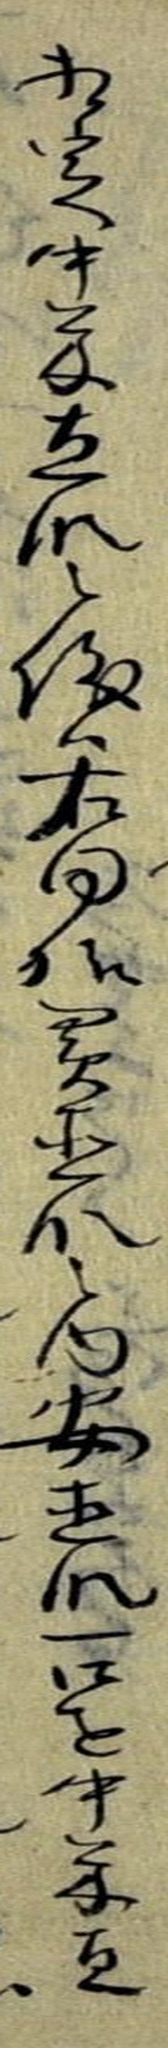相定中米直段之儀ハ右同様買直段之内安直段一口を中米直
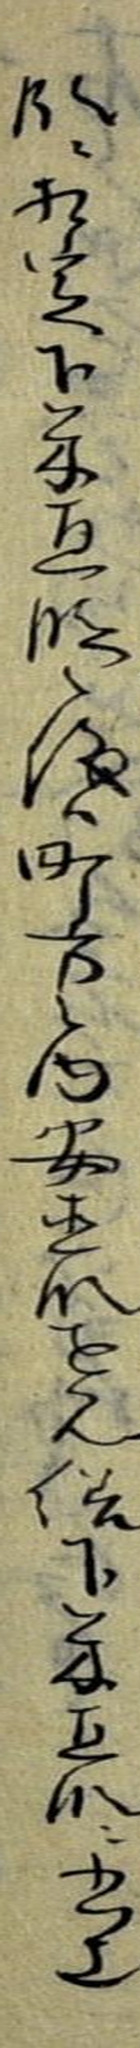段ニ相定下米直段之儀ハ町方之内安直段を見繕下米直段ニ書出
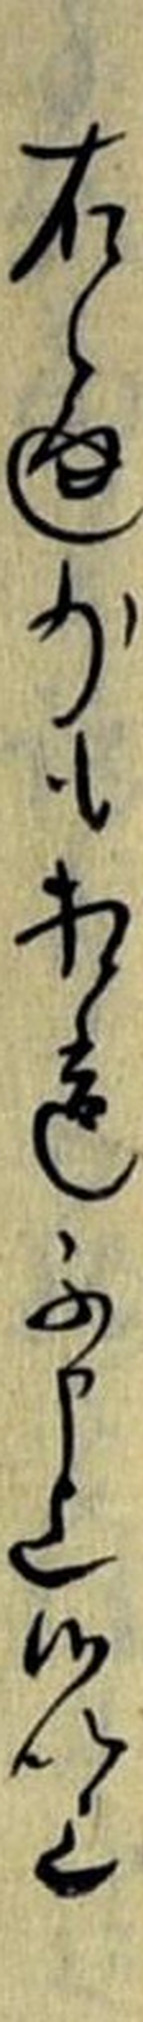右之通少も相違不申上候以上
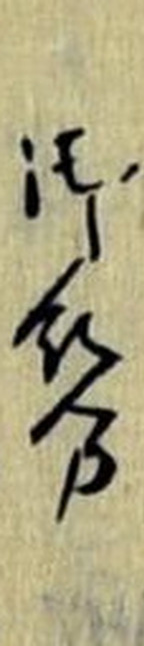御領分
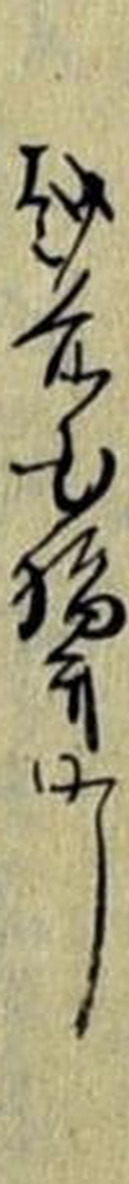越前国福井町
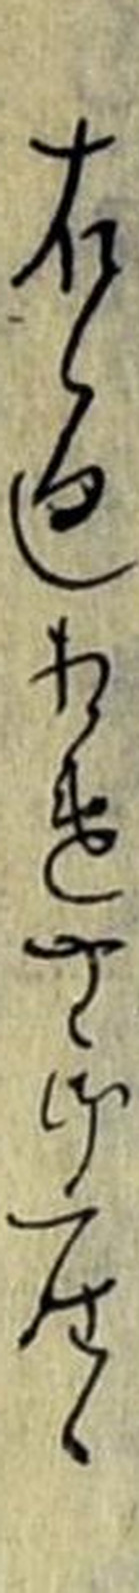右之通相違無御座候
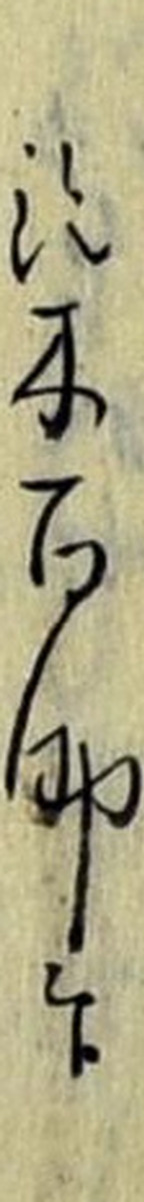鈴木百助印
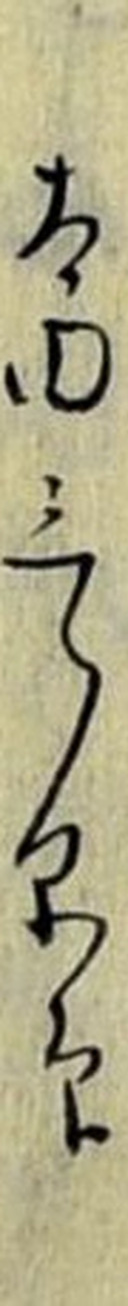太田三郎兵衛印
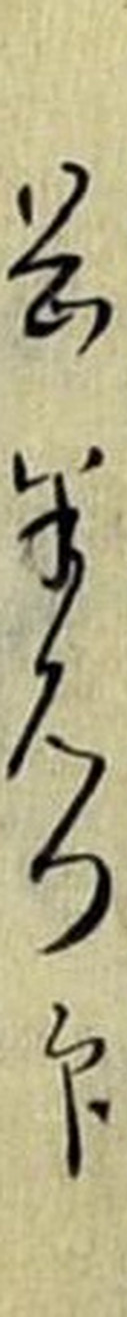岡半右衛門印
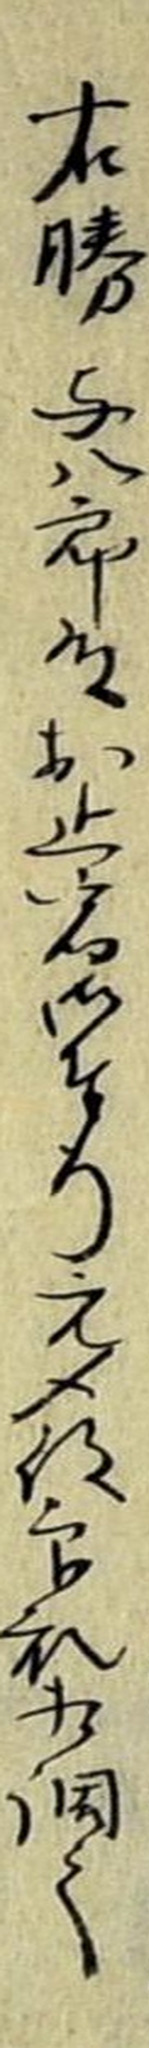右勝与八郎殿於止宿御奉行元〆役印形相調之
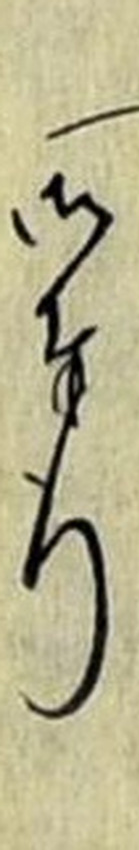御奉行
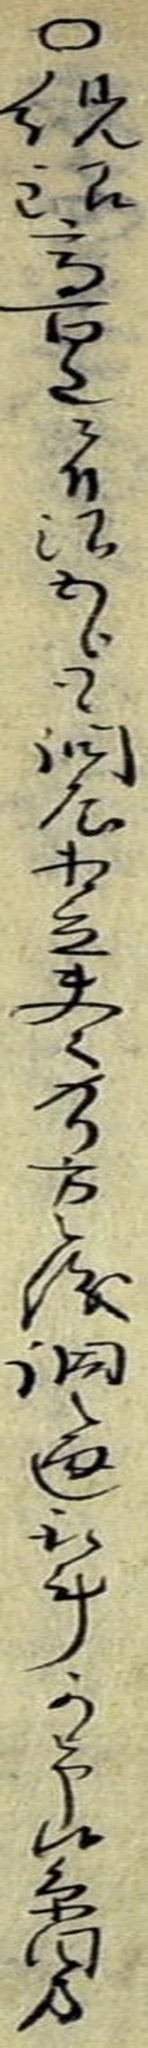○繭銀高百匁ニ付銀五分ツヽ問屋相立夫々〆り方之儀調之通取計可被申候糸目方
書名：命令之部 三
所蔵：福井県文書館 Fukui Prefectural Archives
